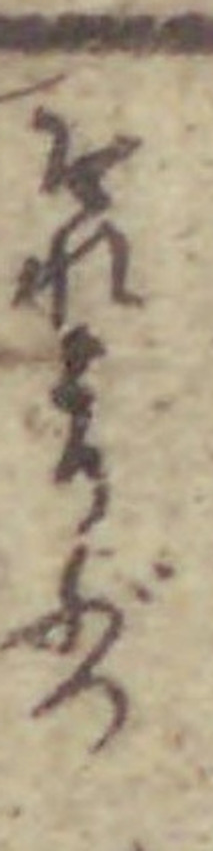それよりぶつ
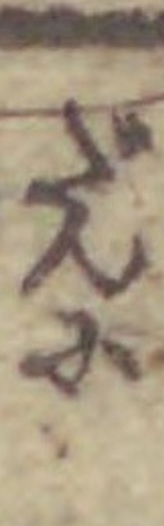だんに
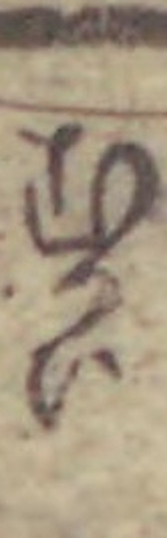むかい
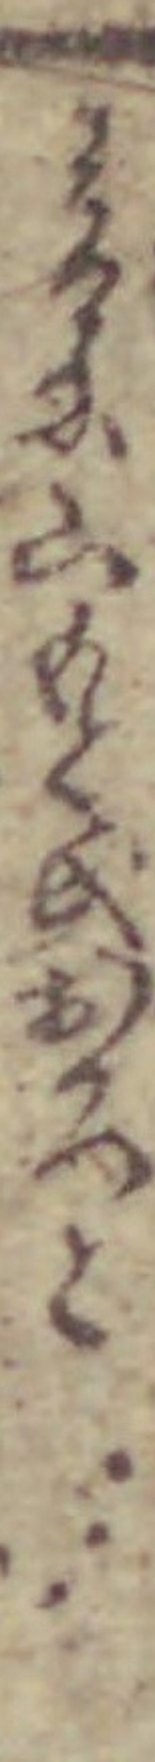みるに山もと氏おかつと
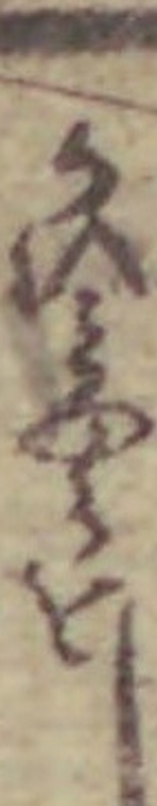かいみやうを
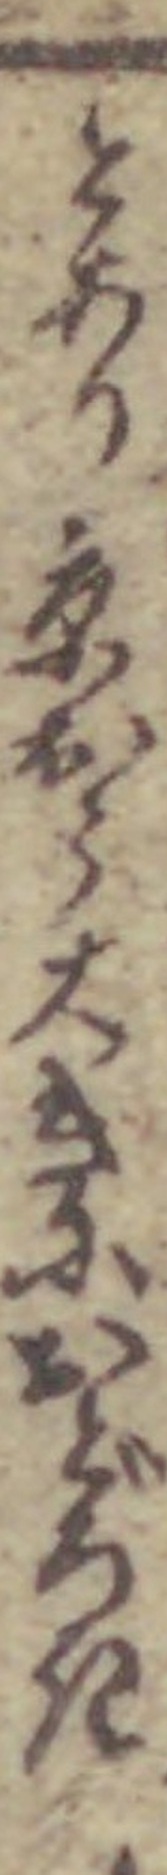とあり京おう大きにおどろき
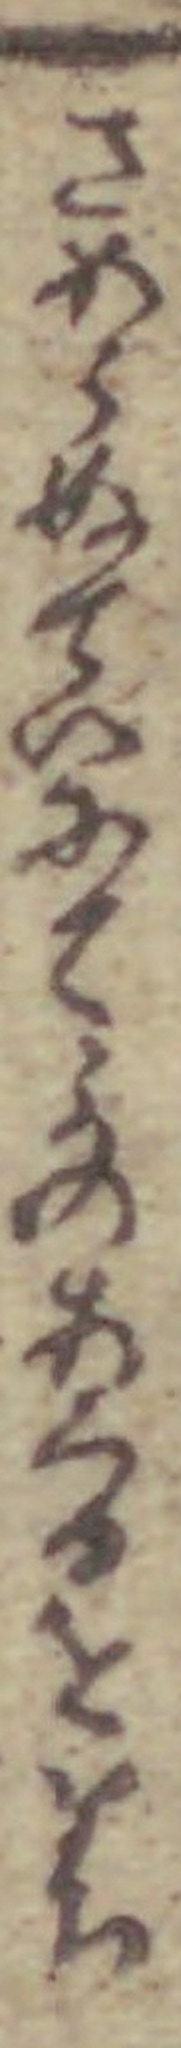さめらぬていにてよのあくるをまち
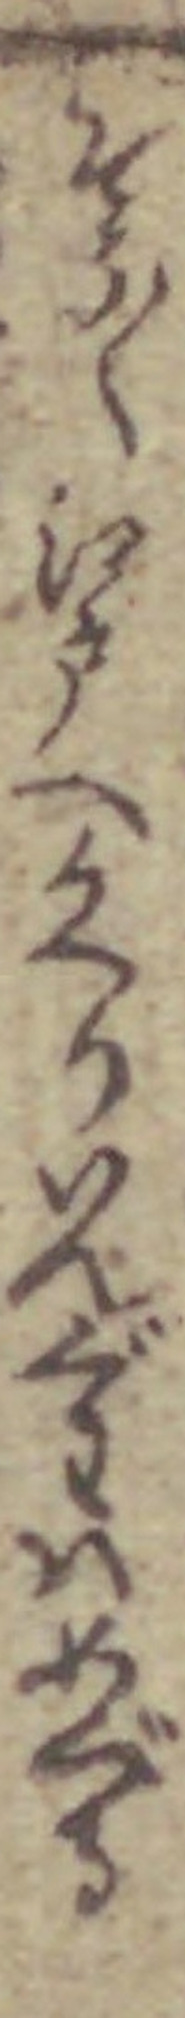そう〳〵江戸へかへりいんぐわはめぐる
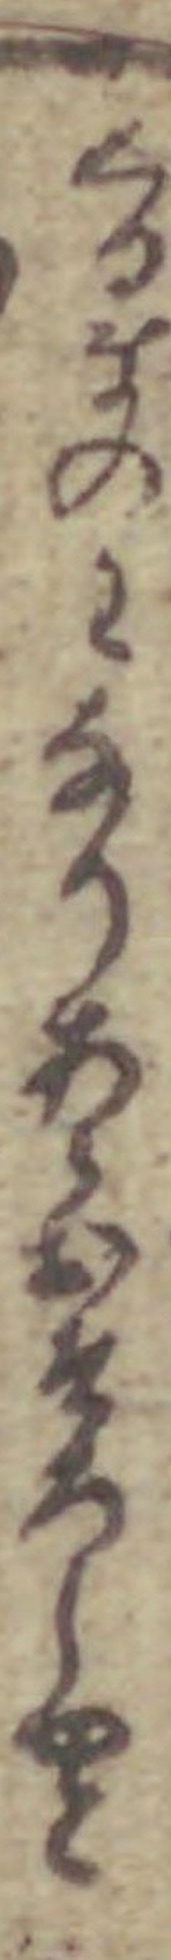くるまのわなりあらおそろしやと
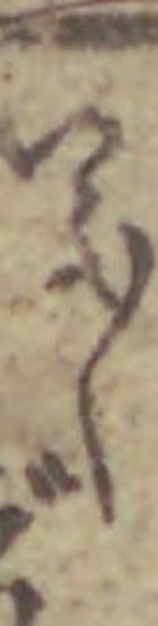いよ〳〵
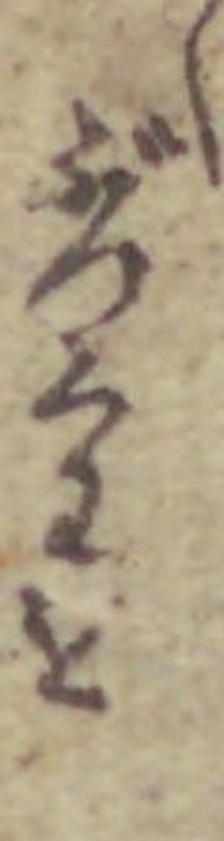ぶつくわを
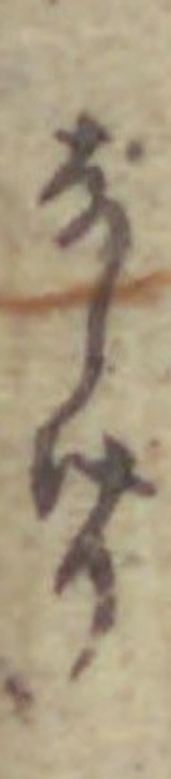なしけり
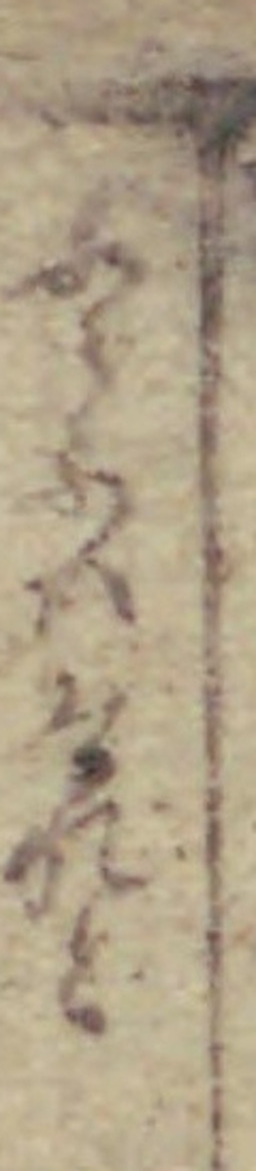ふうふはそれと
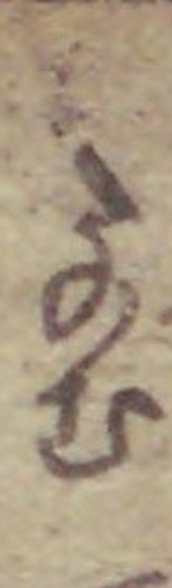たのむ

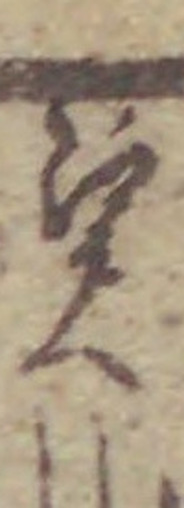江戸へ
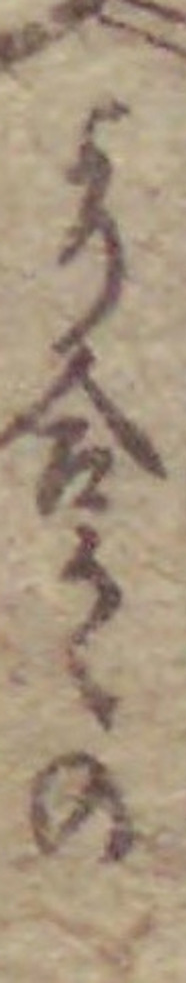より合かくの
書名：大通其面影 2巻
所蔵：国立国会図書館 National Diet Library, JAPAN
